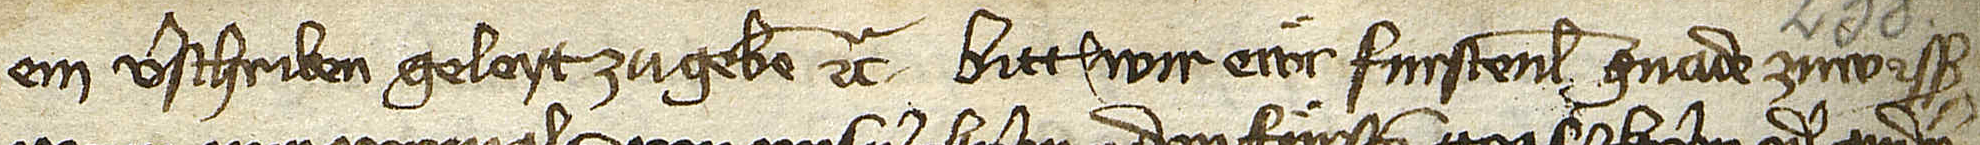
ein v*ſchriben geleyt ʒu gebe* ec* / bitt* wir ewr furſtenl* gnade ʒuwiſſ*
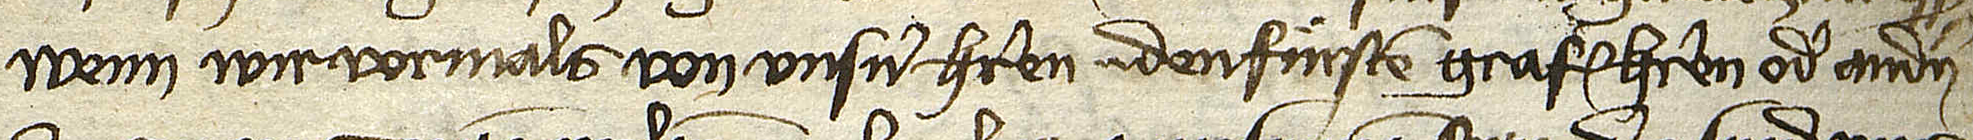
Wenn wir vormals von vnſ*n h*ren ~ den fürſte* graf* h*ren od* and*n
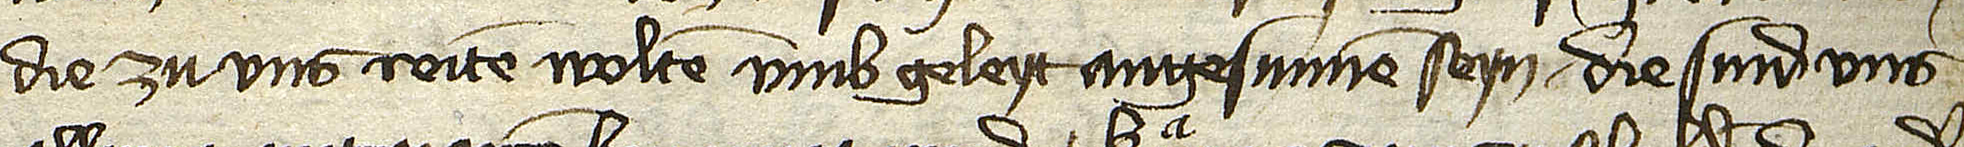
die ʒu vns reite* wolte* vmb geleyt angeſunne* ſeyn / die ſind vns
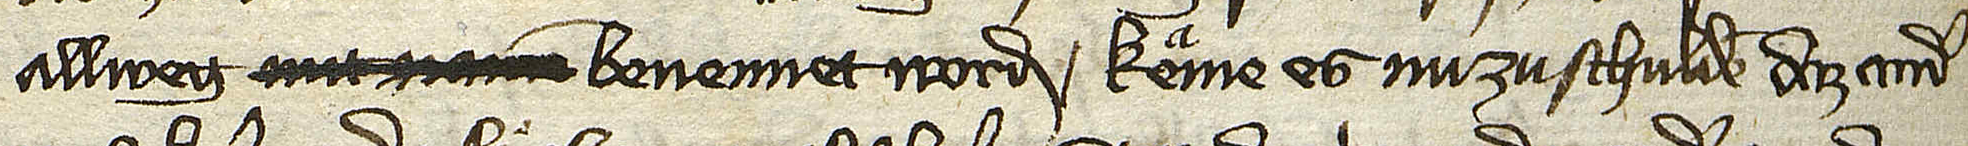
allweg mit name* benennet word* / këme es nu ʒu ſchulde* daʒ and*
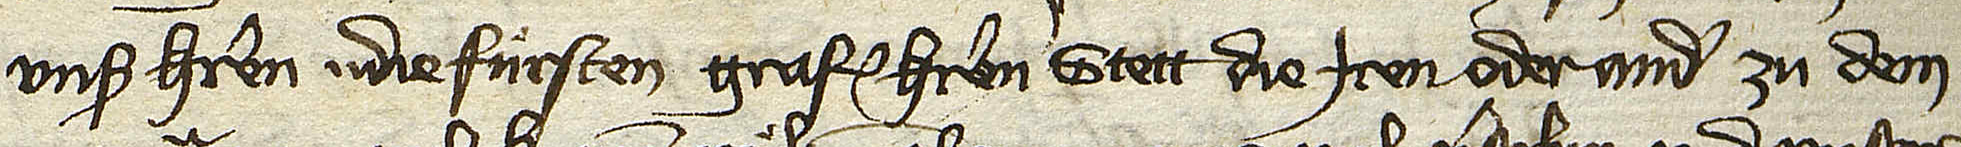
vnſ* h*ren ~ die fürſten graf* h*ren Stett die Iren oder and* ʒu dem
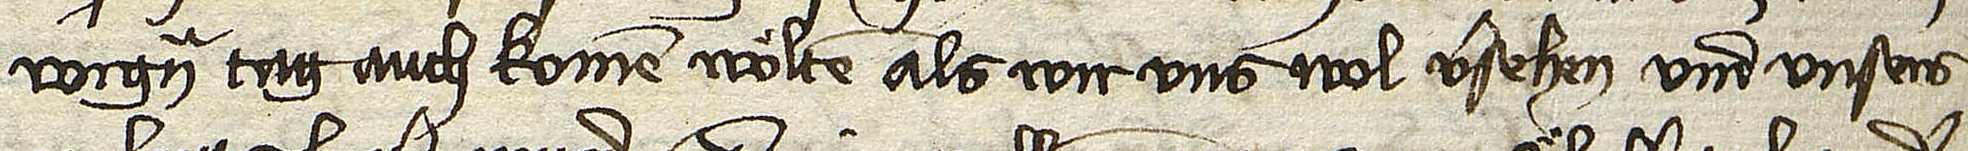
vorg*n tag auch kome* wölte* als wir vns wol v*ſehen vnd vnſers
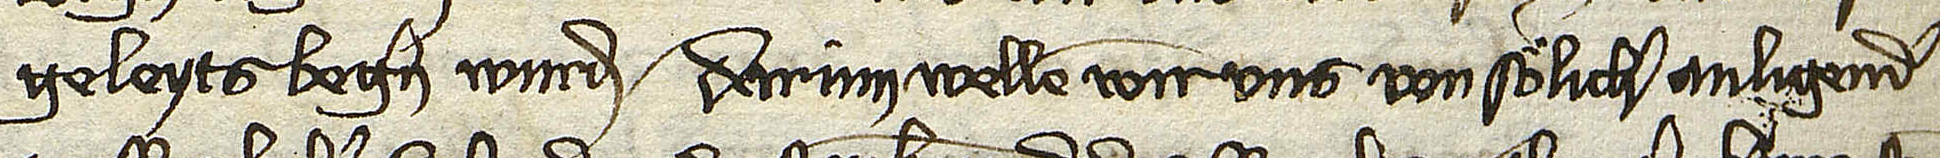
geleyts beg*n wurd* / Darinn welle* wir vns von ſölich* anligend*
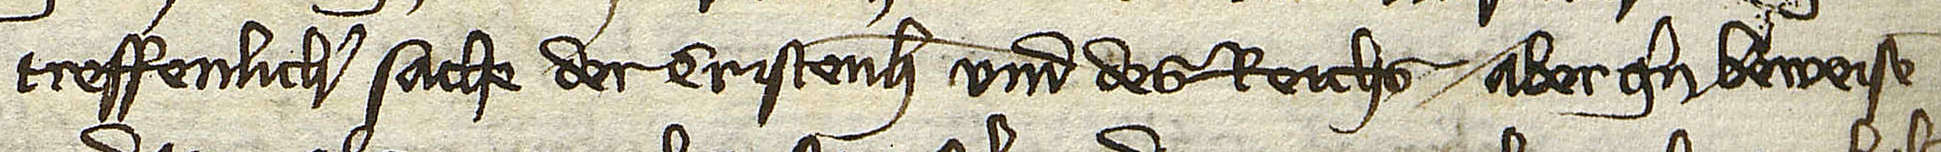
treffenlich* ſache der Criſtenh* vnd des Reichs / aber g*n beweiſe*
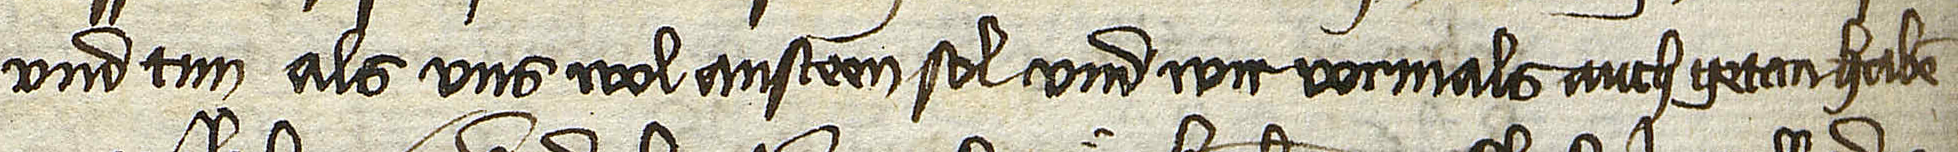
vnd tun als vns wol anſteen ſol vnd wir vormals auch getan habe*
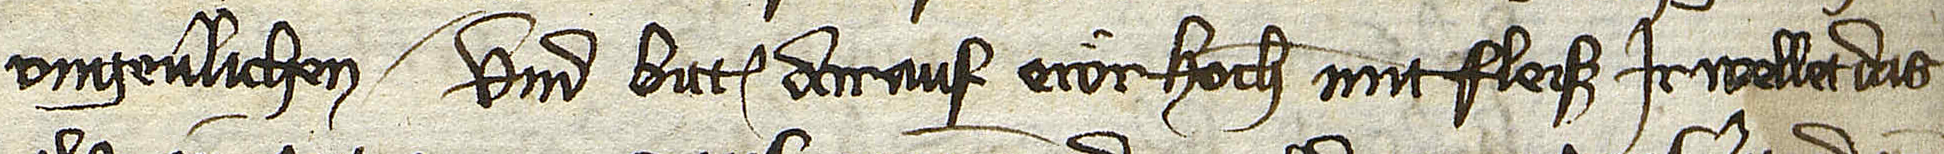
vngeu*lichen / Vnd bitt* darauf ewr hoch* mit fleiſʒ Ir wellet das
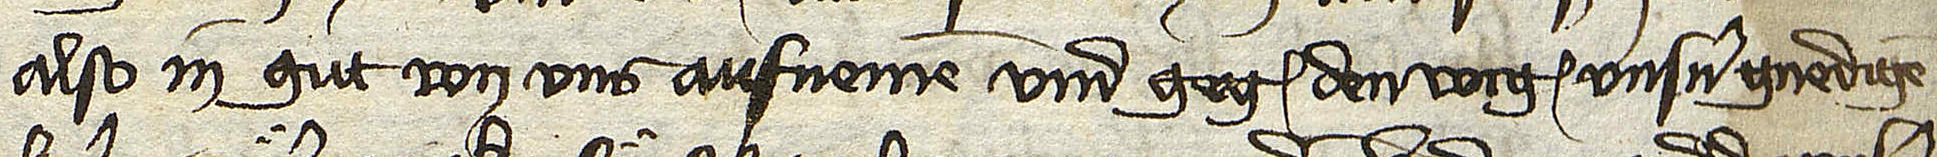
alſo in gut von vns aufneme* vnd geg* den vorg* vnſ*n gnedige*
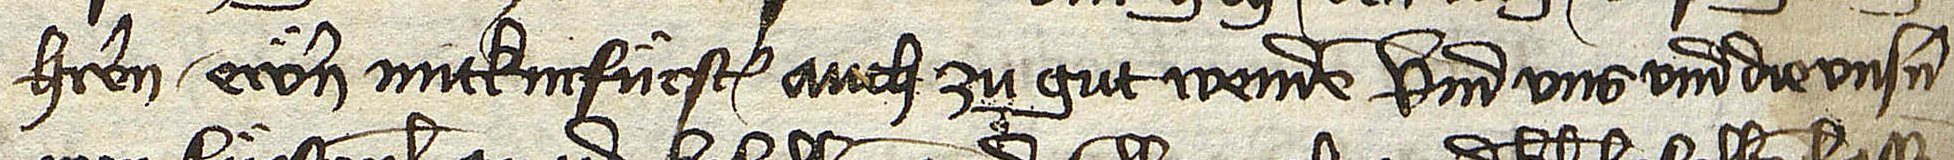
h*ren / ew*n mitkurfürſt* auch ʒu gut wende* Vnd vns vnd die vnſ*n
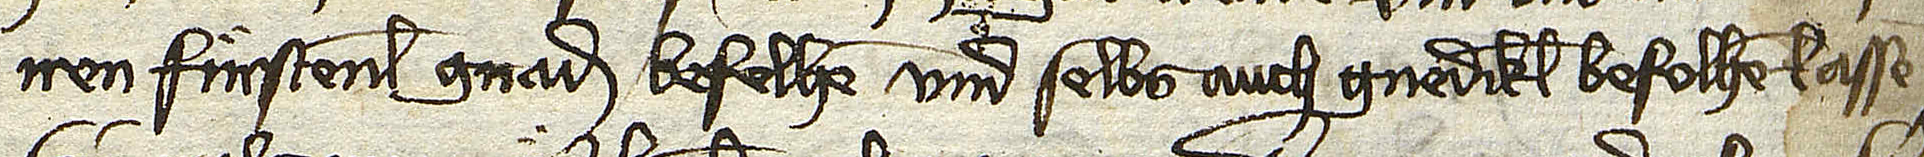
iren fürſtenl* gnad* befelhe* vnd ſelbs auch gnedikl* befolhe* laſſe*
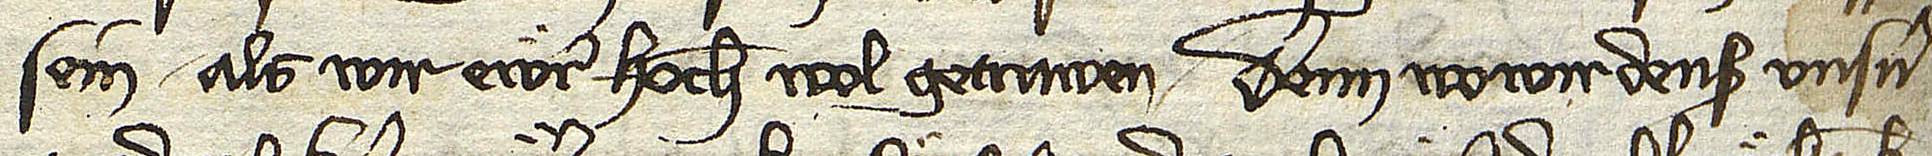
ſein / als wir ew*r hoch* wol getrawen / Denn wo wir denſ* vnſ*n
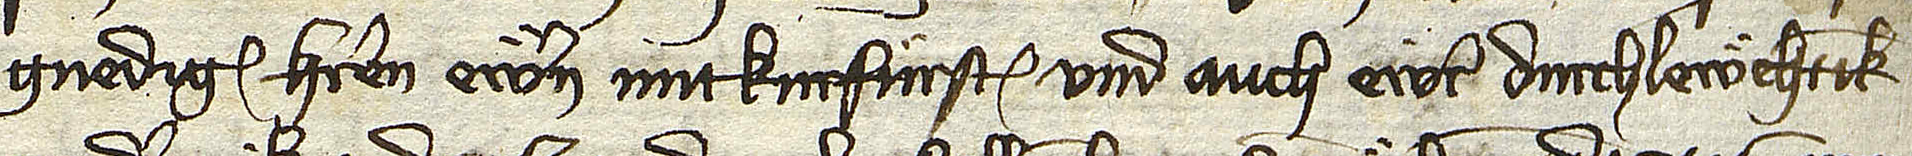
gnedig* h*ren ew*n mitkurfürſt* vnd auch ew*r durchlewchtik*
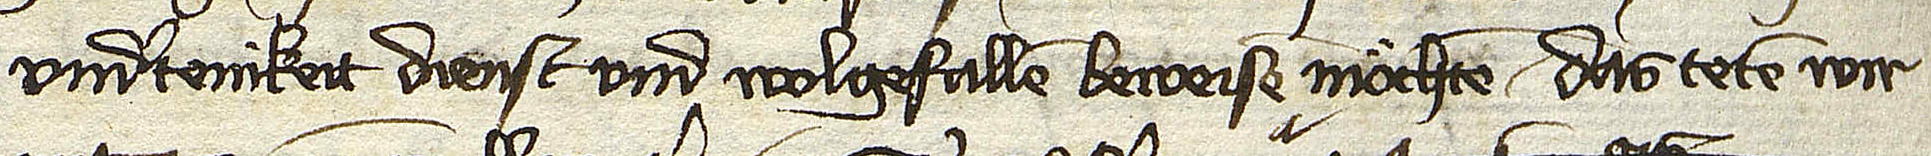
vnd*tenikeit dienſt vnd wolgefalle* beweiſe* möchte* / das tete* wir
